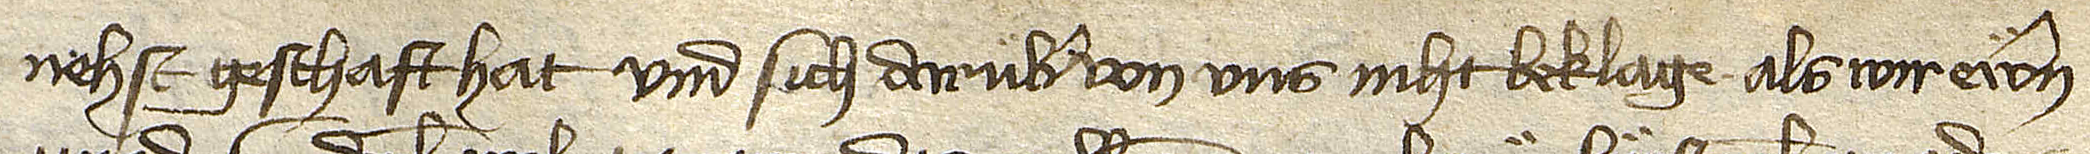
nehſt geſchaft hat vnd ſich darüb* von vns niht beklage . als wir eẅ*n
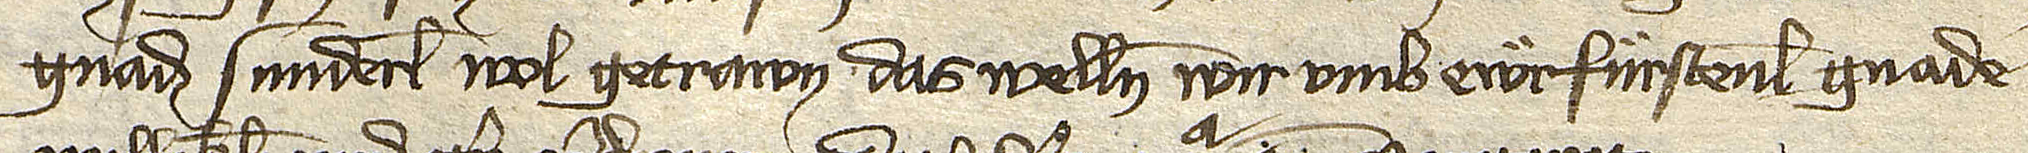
gnad* ſunderl* wol getrawn das welln* wir vmb eẅr fürſtenl* gnade
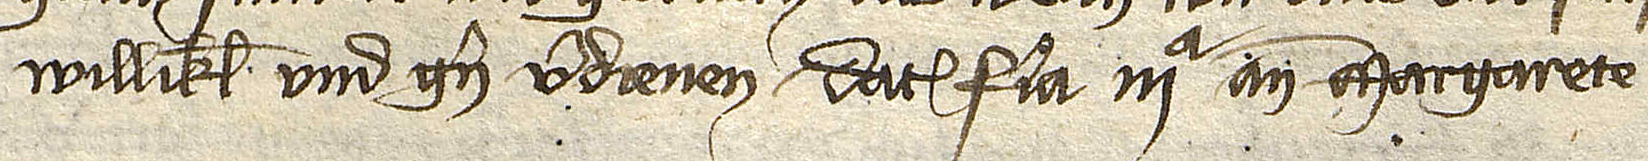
willikl* vnd g*n v*dienen / Dat* fi*a iii* an* Margarete
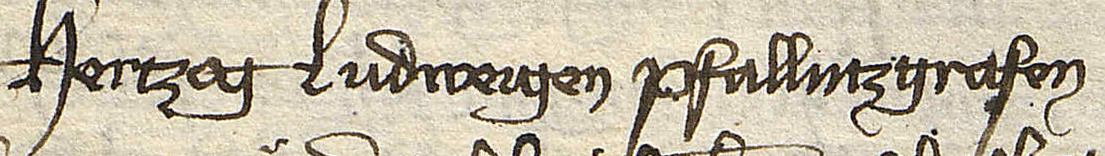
Hercʒog Ludweigen Pfallncʒgrafen
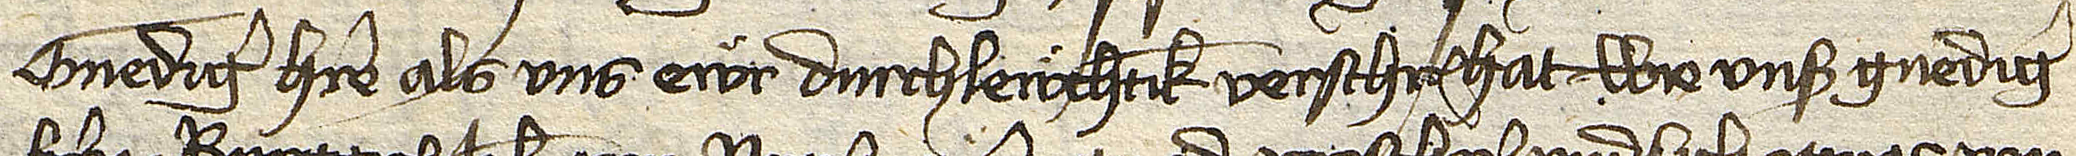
Gnedig* h*re als vns eẅr durchleẅchtik* verſchr* hat wie vnſ* gnedig*
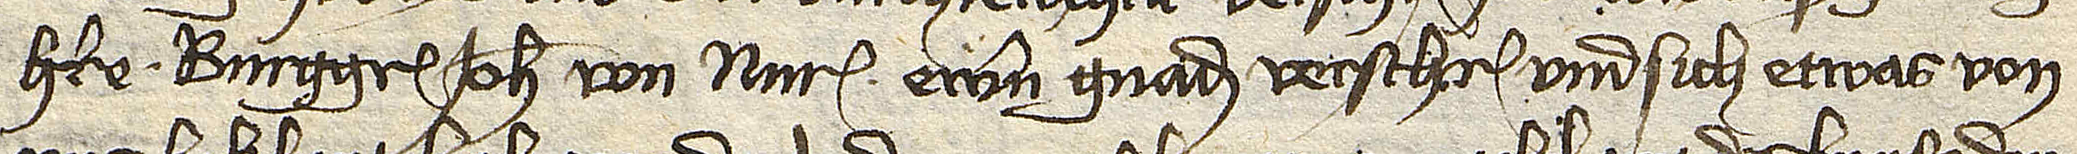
h*re . Burggr* Ioh* von Nur* . eẅ*n gnad* verſchr* vnd ſich etwas von
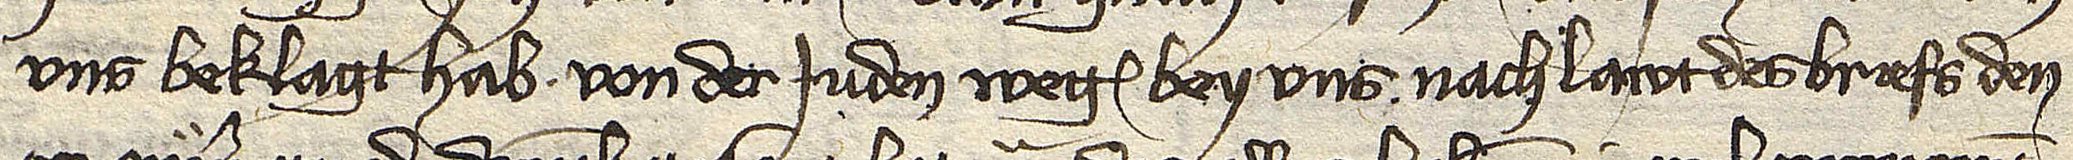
vns beklagt hab . von der Iuden weg* bey vns nach lawt des briefs den
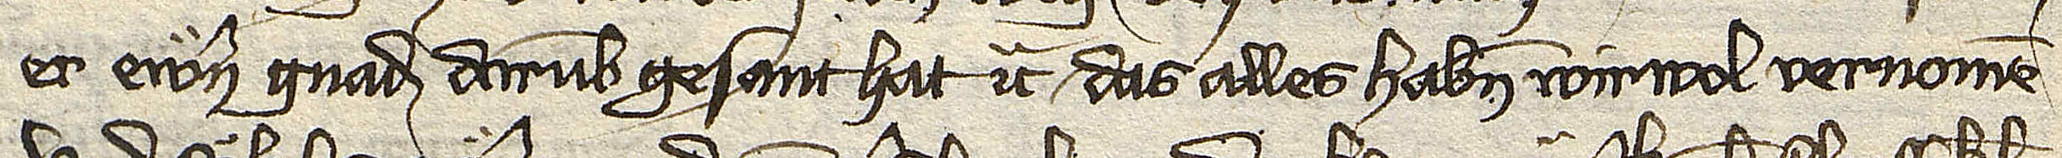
er eẅ*n gnad* darub* geſant hat ec* / Das alles habn* wir wol vernome*
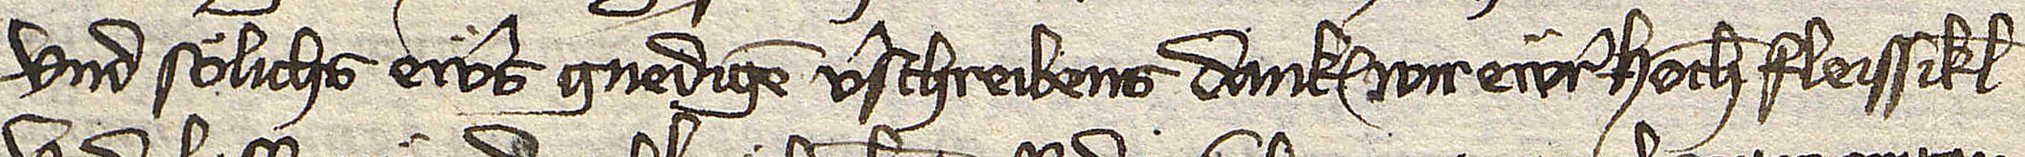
Vnd ſölichs eẅ*s gnedige* v*ſchreibens dank* wir eẅr* Hoch* fleiſſikl*
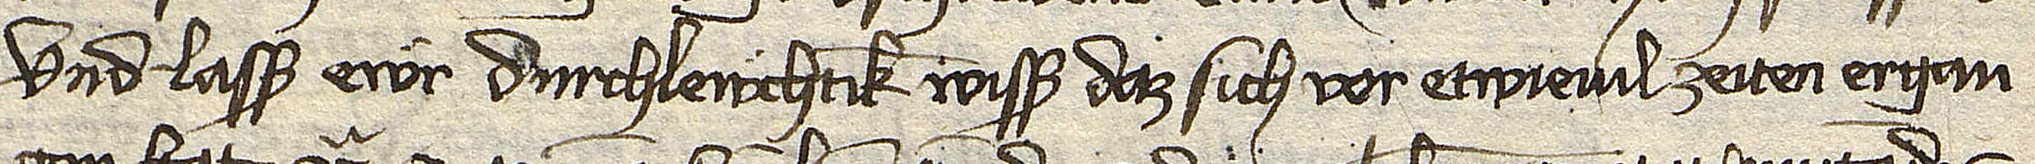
Vnd laſſ* eẅr durchleẅchtik* wiſſ* daʒ ſich vor etwieuil ʒeiten ergan
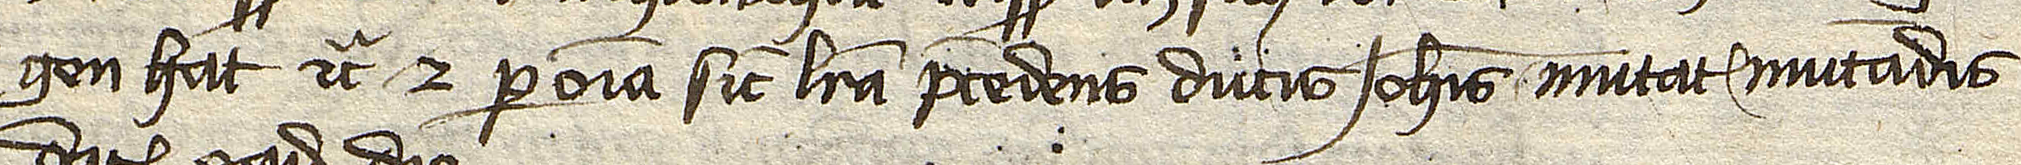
gen hat ec* @ poia* ſic* lra* p*cedens ducis Iohis* mutat* muta*dis
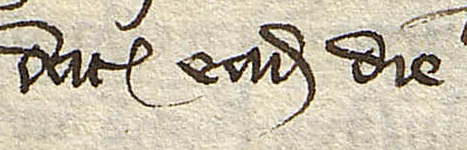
Dat* ead* die
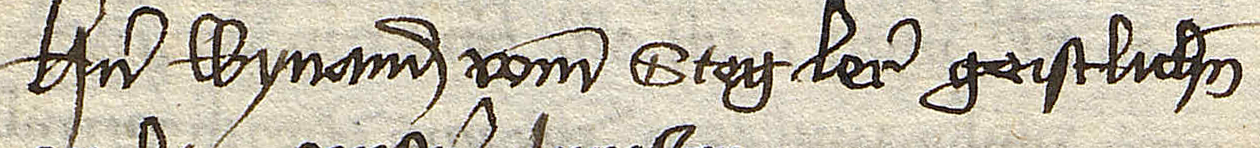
Hn* Wynand* vom* Steg ler* geiſtlichn*
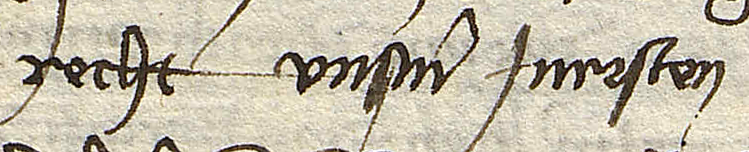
recht vnſm* Iuriſten
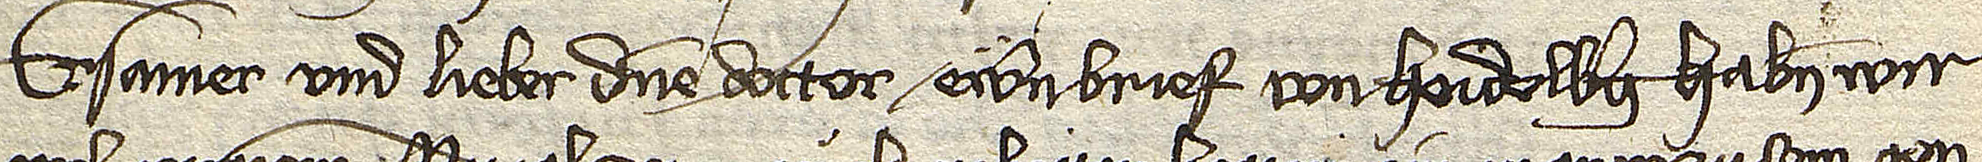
Erſamer vnd lieber dne* dottor / eẅ*n brief von heildelb*g habn* wir
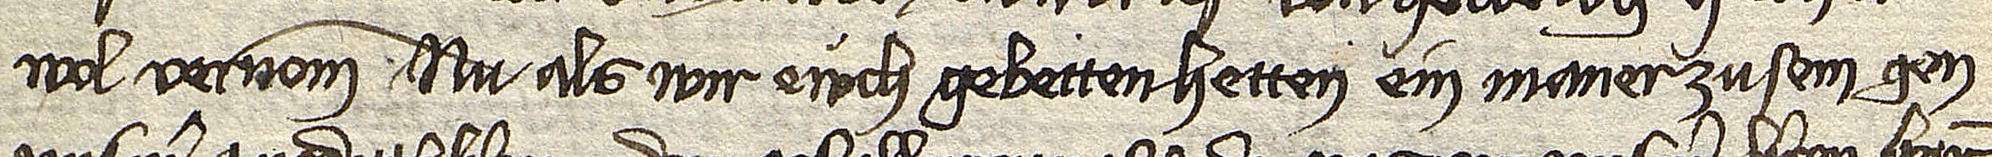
wol vernom* / Nu als wir eẅch gebetten hetten ein maner ʒu ſein gen
